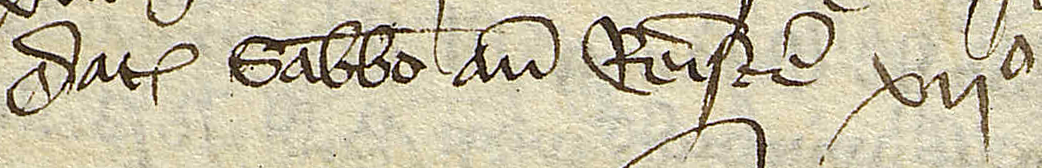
Dat* Sabbo* an* Reiſce* xii*
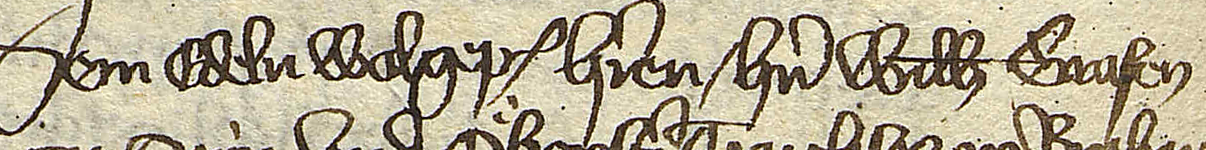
Dem Edeln wolgep* hr*en / hn* wilh* Grafen
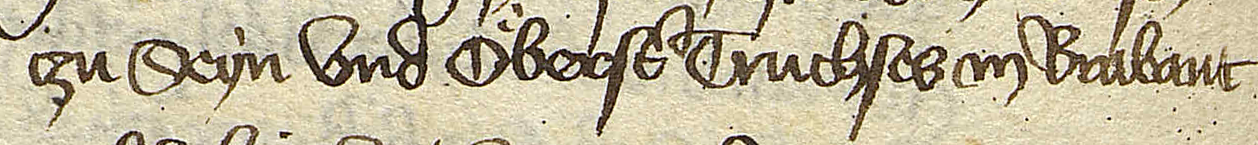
cʒu Seyn vnd Öberſt* Truchſes in Brabant
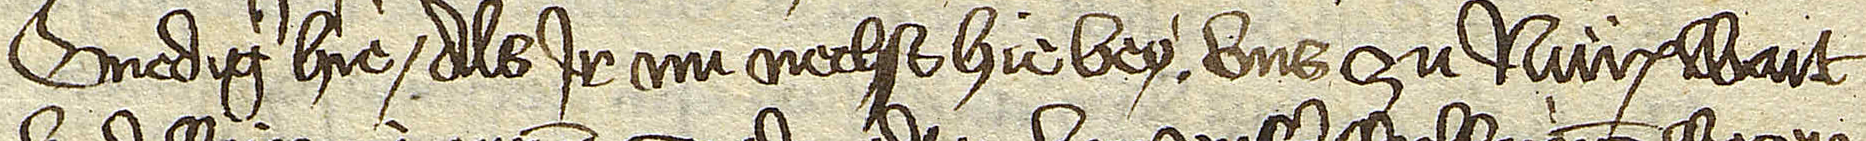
Gnedig* h*re / Als Ir nu nechſt hie bey . vns cʒu Nür* wart
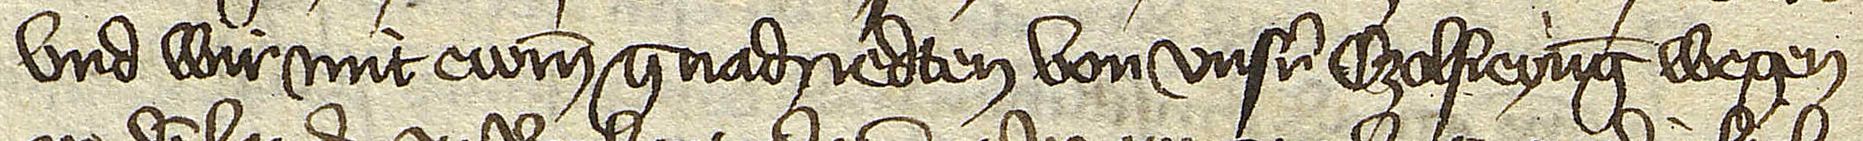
vnd wir mit ewrn* gnad* redten von vnſr* Cʒolfreyug* wegen
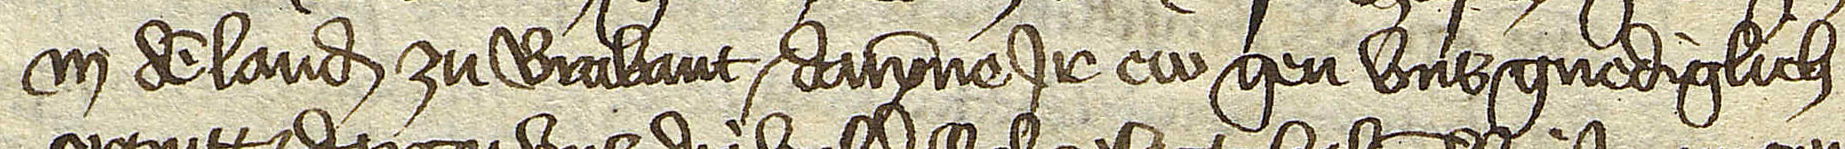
in de* land* cʒu Brabant / daryne* Ir ew gen vns gnediglich
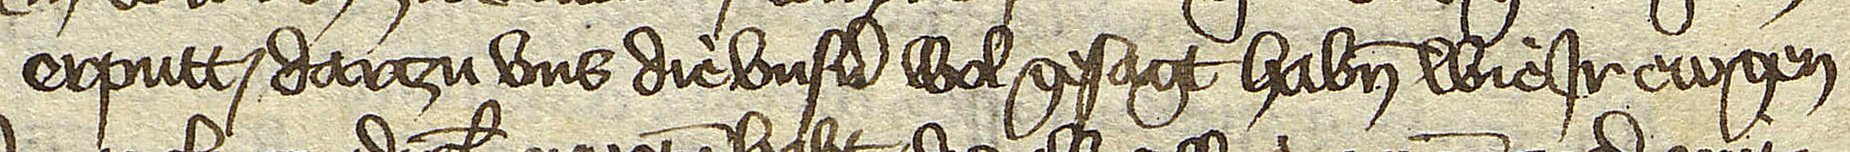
erputt / darcʒu vns die vnſn* wol geſagt habn* wie Ir ew gen
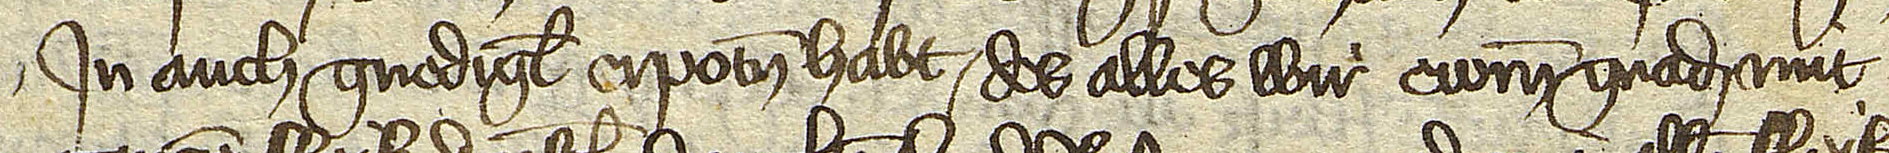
In auch gnedigl* erpotn* habt / des alles wir ewrn* gnad* mit
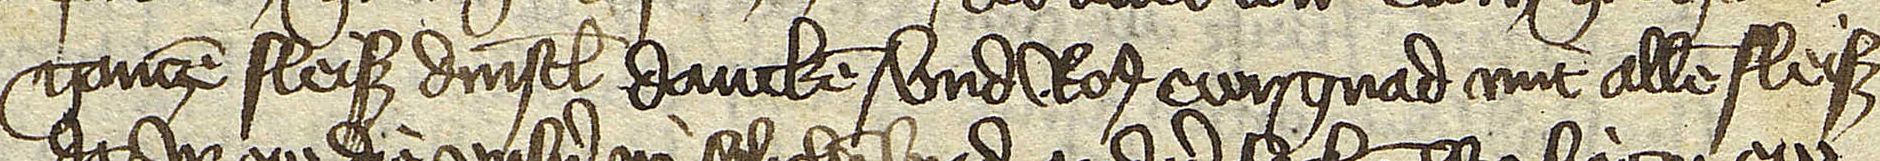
gancʒe* fleiſʒ dinſtl* dancke* / vnd Ro* ewr gnad mit alle* fleiſʒ
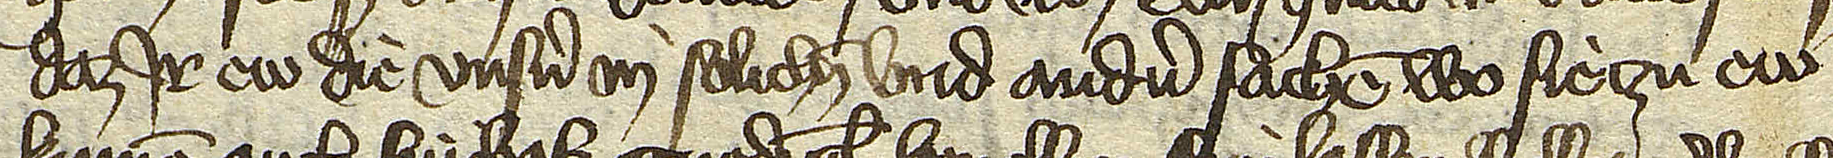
daʒ Ir ew die vnſn* in ſolichn* vnd andn* ſache* wo ſie cʒu ew
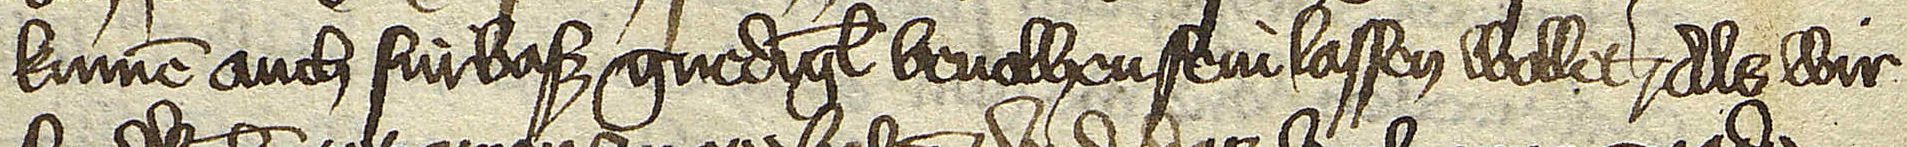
kume* auch fürbaſʒ gnedigl* beuolhen ſein laſſen wollet / Als wir
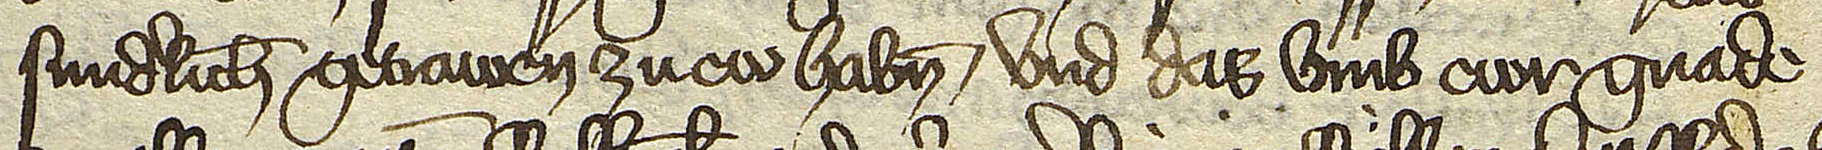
ſund*lich* getrawen cʒu ew habn* / vnd das vmb ewr gnade
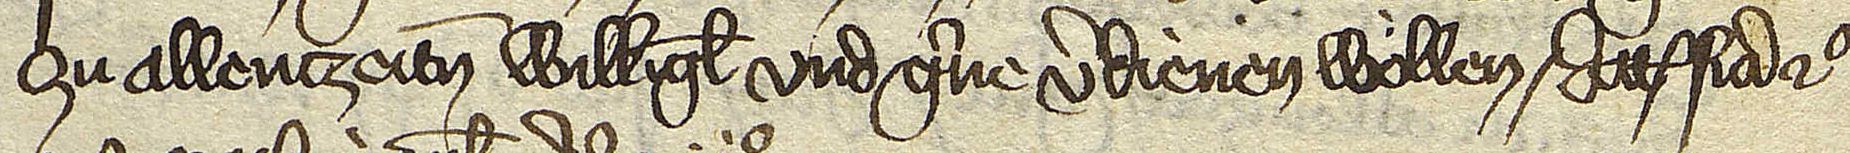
cʒu allencʒeitn* willigl* vnd g*ne v*dienen wöllen / dat* fia* i*
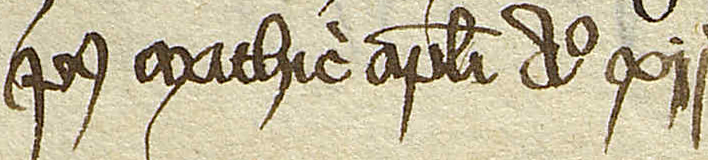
p* Mathie apli* A* xii*
